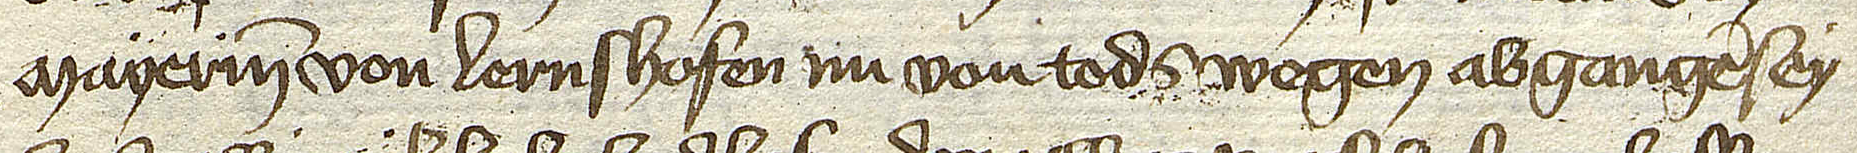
Mayerin* von lernſhofen nu von tods wegen abgange* ſey
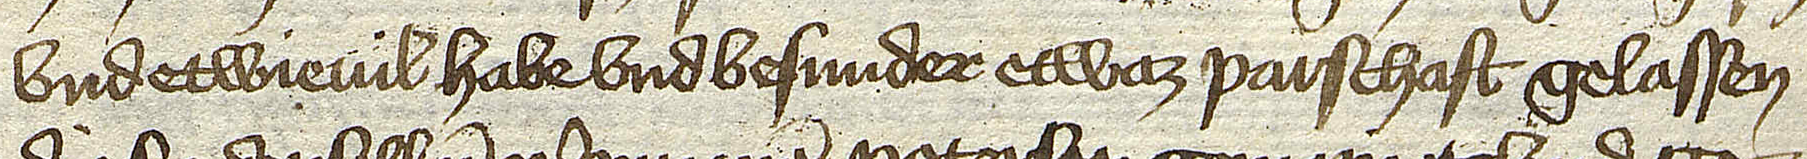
vnd etwieuil habe vnd beſunder etwaʒ parſchaft gelaſſen
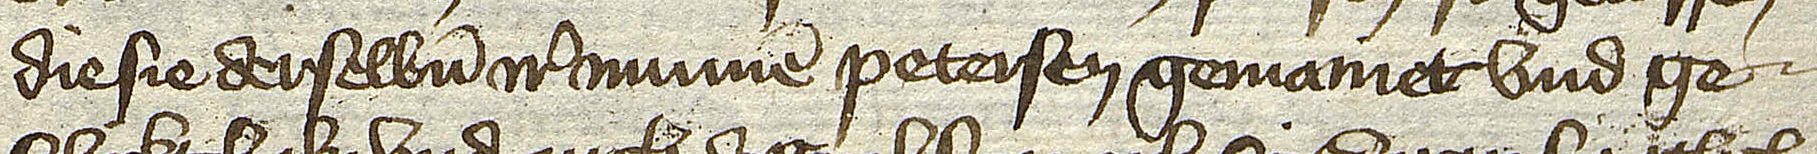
die ſie derſelb*n ir* mume* peterſen gemainet vnd ge =
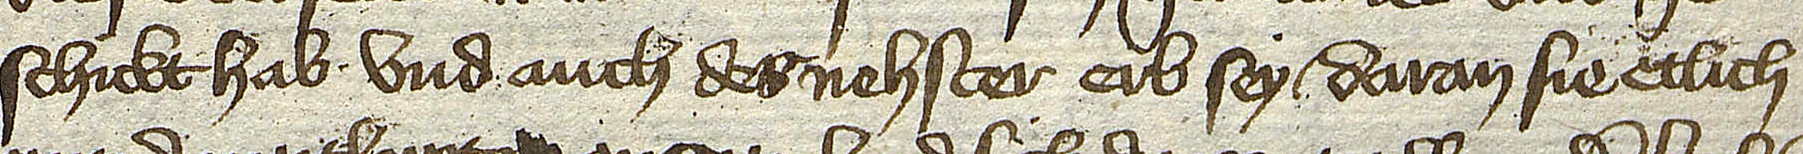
ſchickt hab . vnd auch der nehſter erb ſey / daran ſie etlich
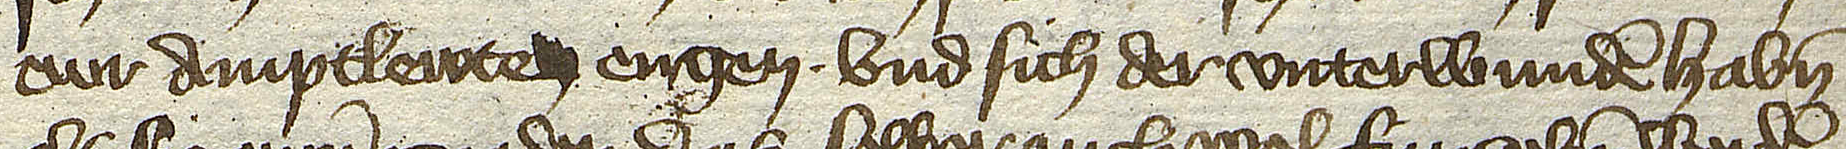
ewr Amptlewten engen . vnd ſich der vnterwunde* hab*n
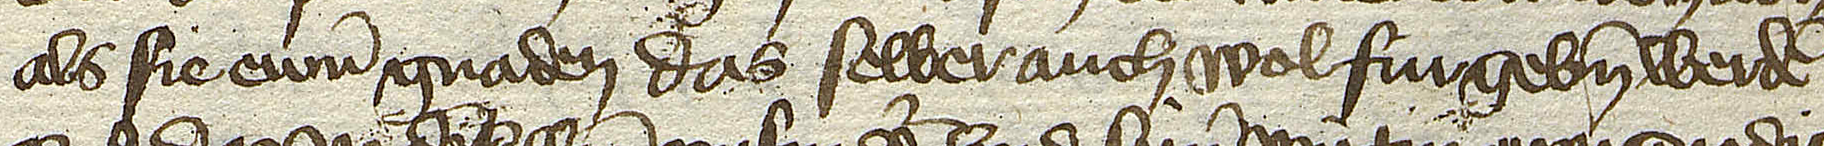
als ſie ew*n gnaden das ſelber auch wol fürgeb*n werde*
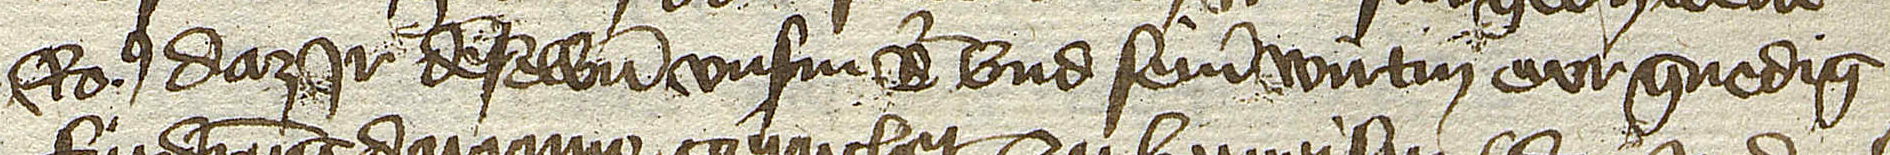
Ro* daʒ Ir de*ſelb*n vnſ*m B* vnd ſein* wirtin ewr gnedig
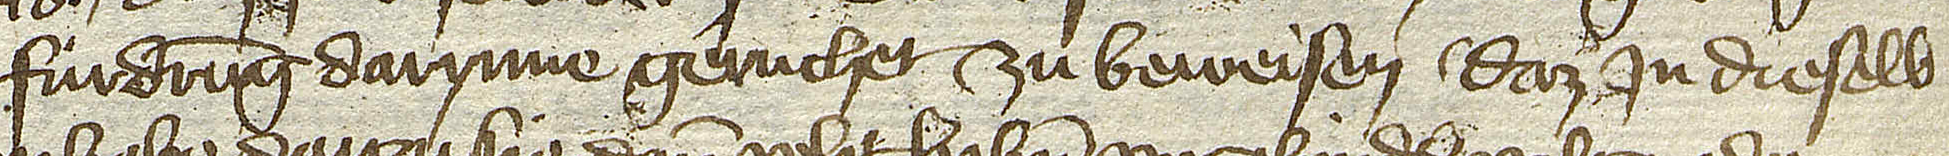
fürdru*g darynne geruchet cʒu beweiſen / daʒ In dieſelb
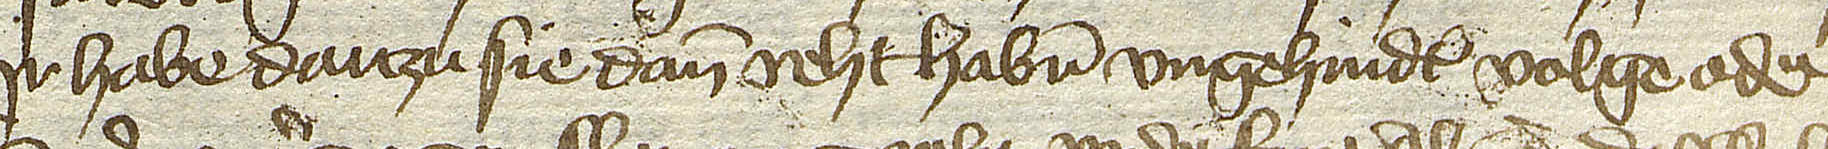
Ir habe darcʒu ſie dan* reht hab*n vngehind*t volge oder
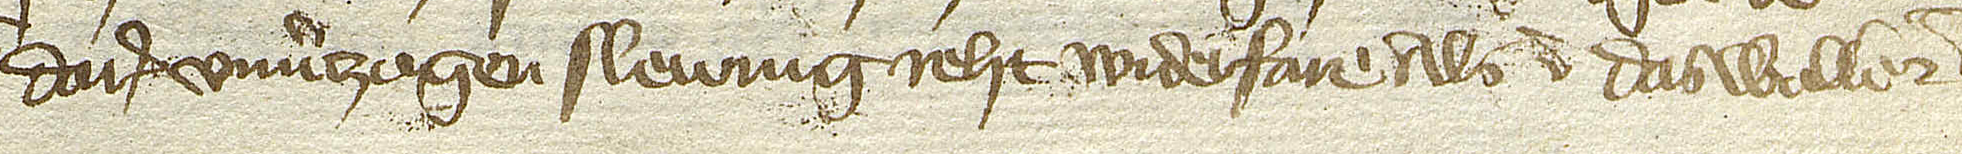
dar* vnu*cʒogen ſleunig reht widerfare Als ec* das wolle* ec*
